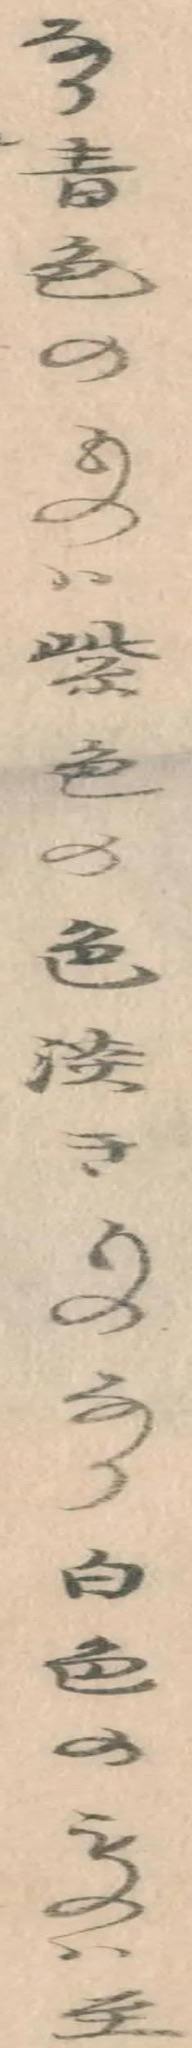なり青色のものは紫色の色淡きものなり白色のものは至
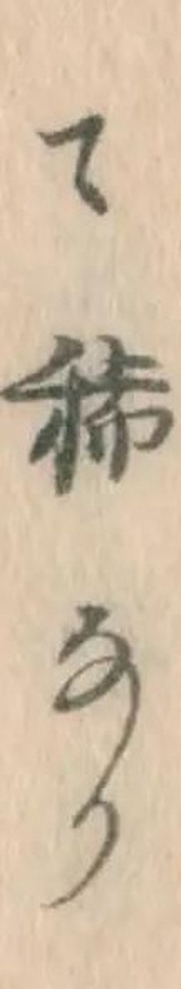て稀なり

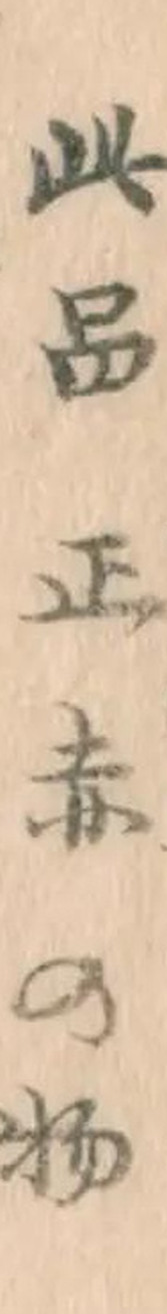此品正赤の物
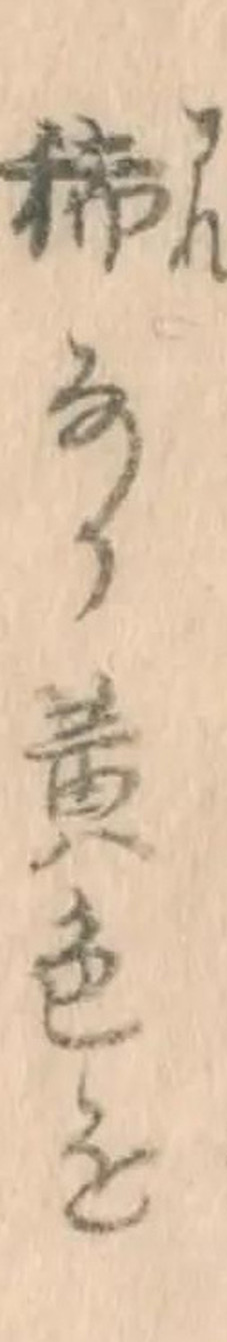稀なり黄色を
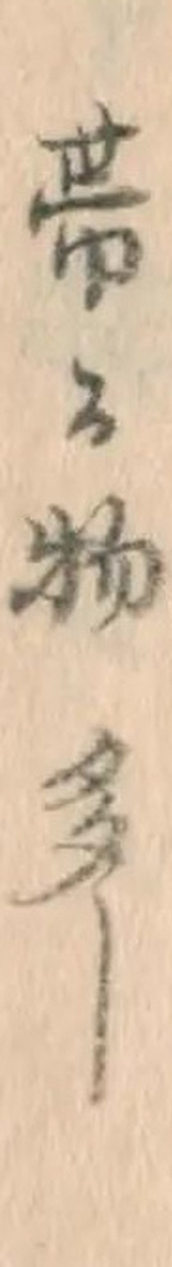帯る物多し

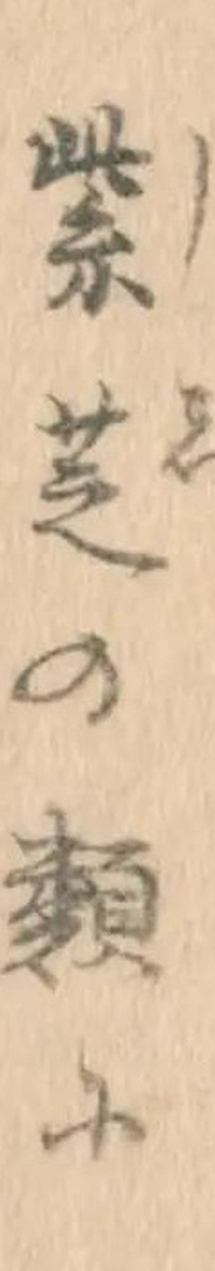紫芝の類に
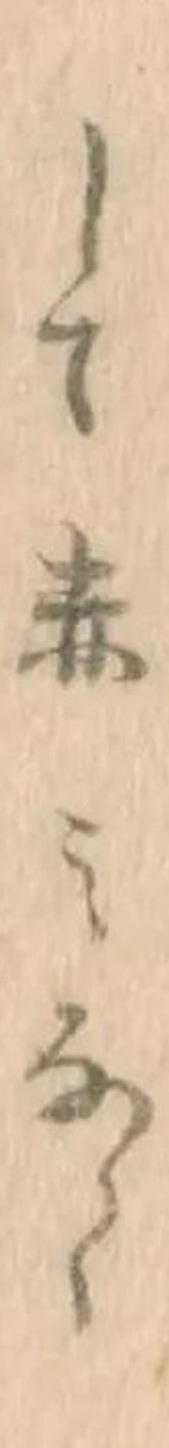して赤みなく
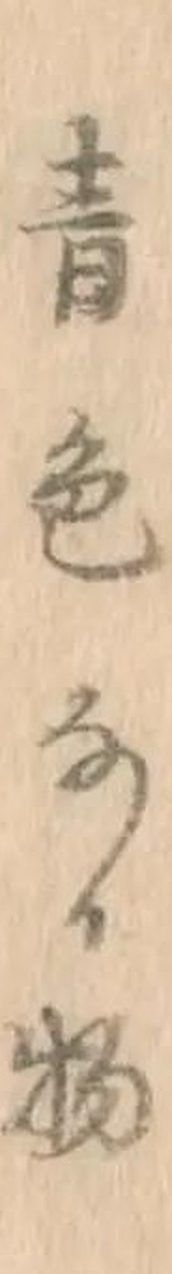青色なる物
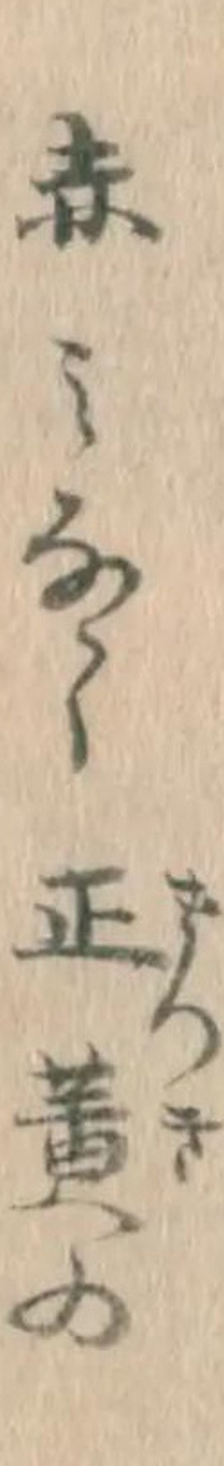赤みなく正黄の
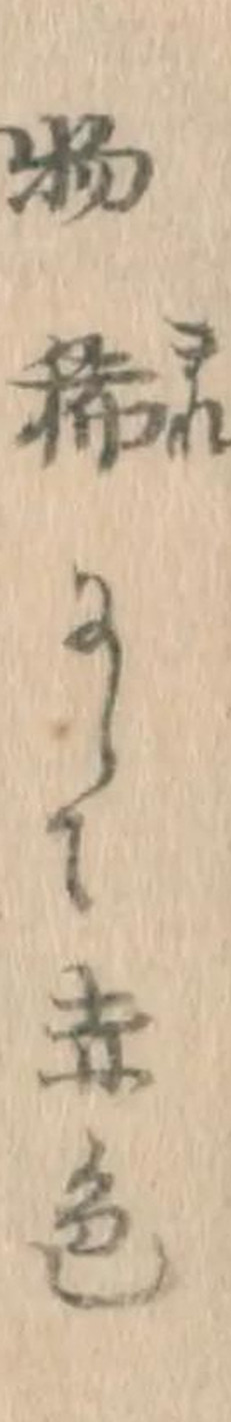物稀にして赤色
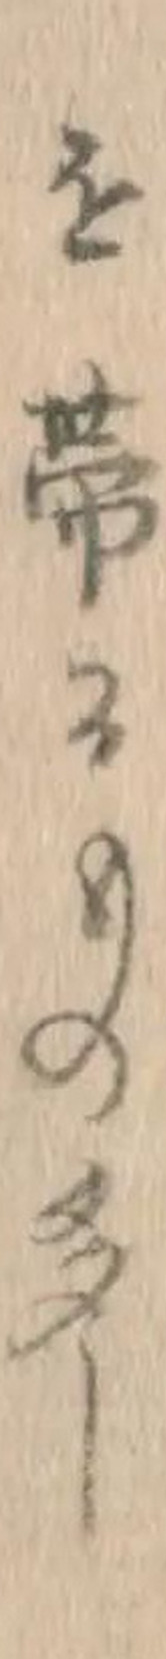を帯るもの多し
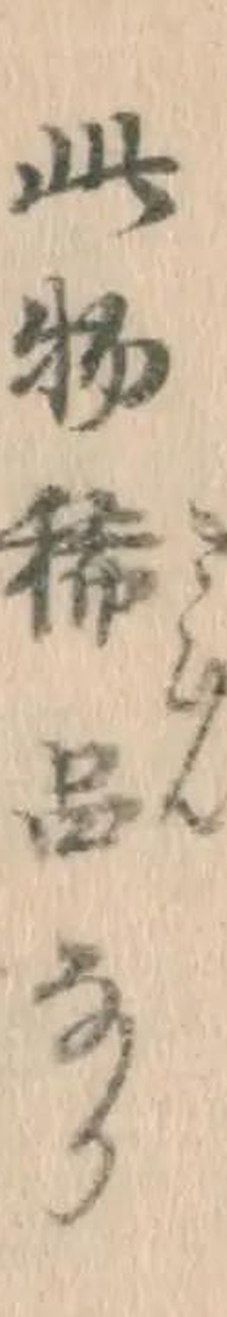此物稀品なり
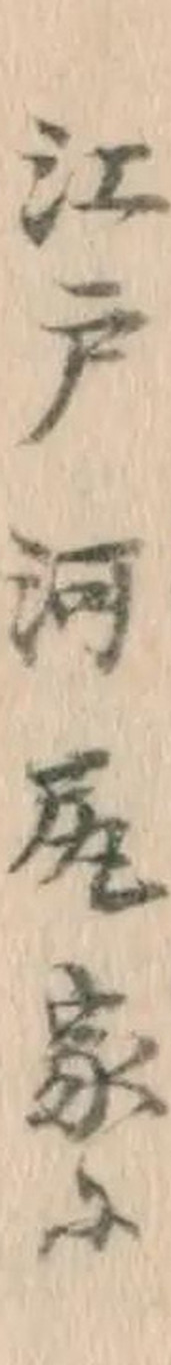江戸河尻家に
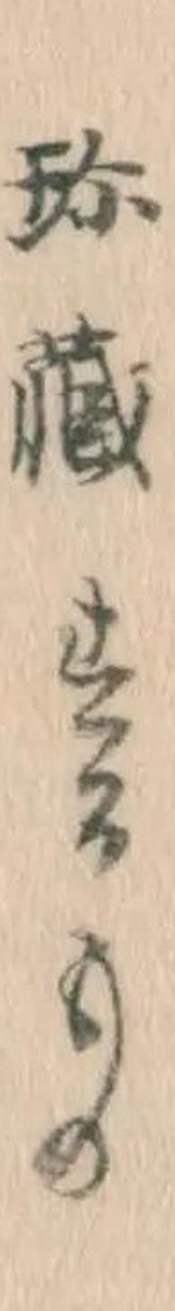珍蔵するもの
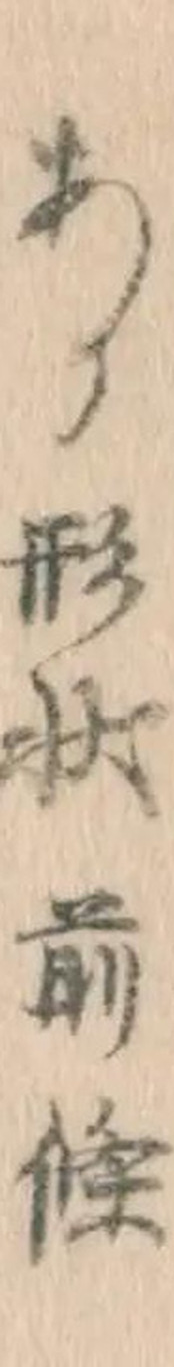あり形状前条
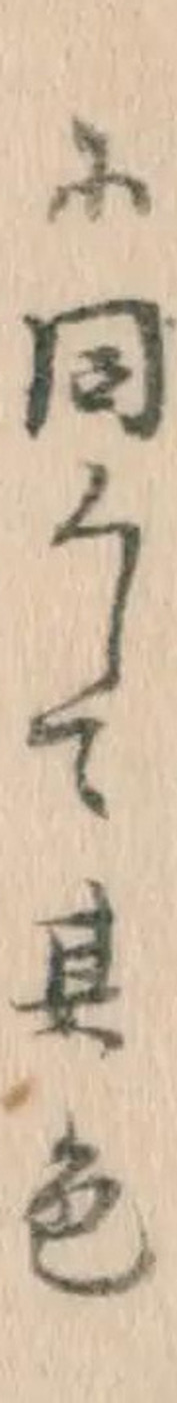に同くして其色
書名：本草図譜. 巻55-57
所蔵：国立国会図書館 National Diet Library, JAPAN
